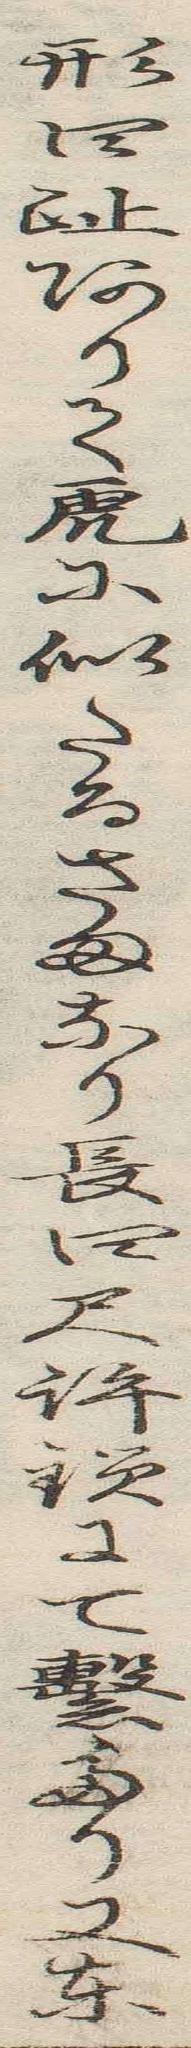形四趾ありて虎に似たるさまなり長四尺許鎖にて繫たり又東
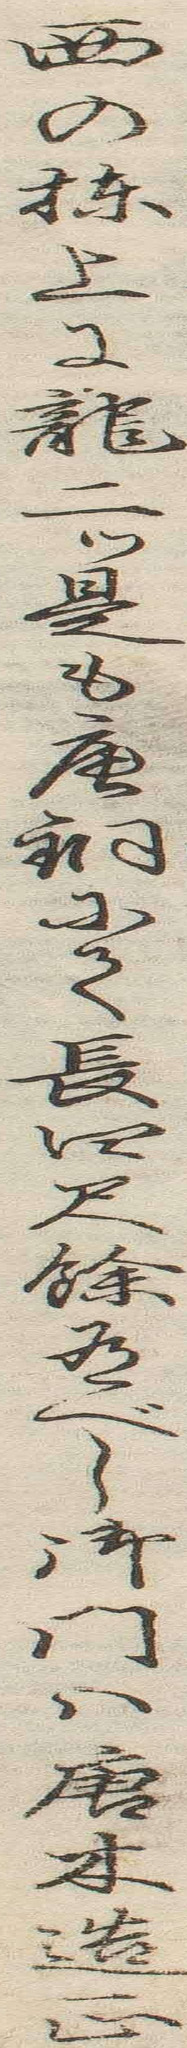西の棟上に龍二ッ是も唐銅にて長四尺餘有べし御門は唐木造正
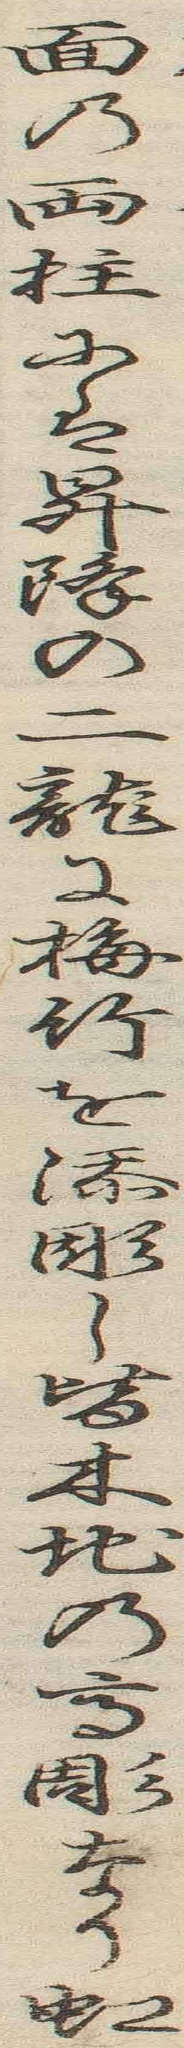面の両柱には昇降の二龍に梅竹を添彫し皆木地の高彫なり虹

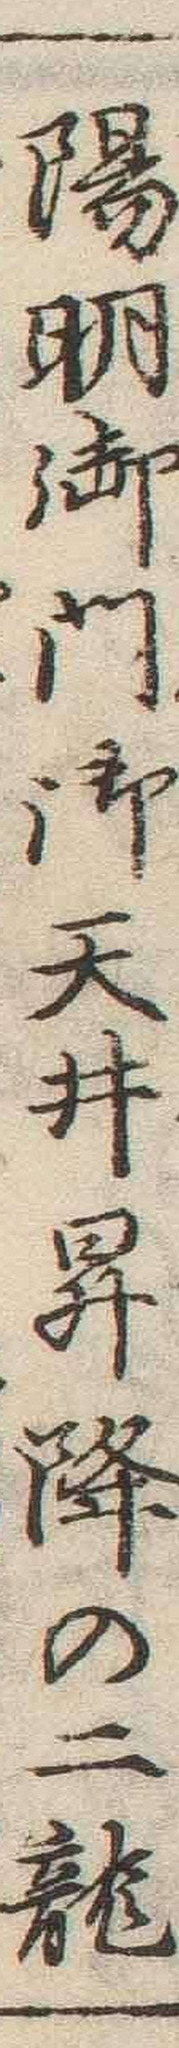陽明御門御天井昇降の二龍
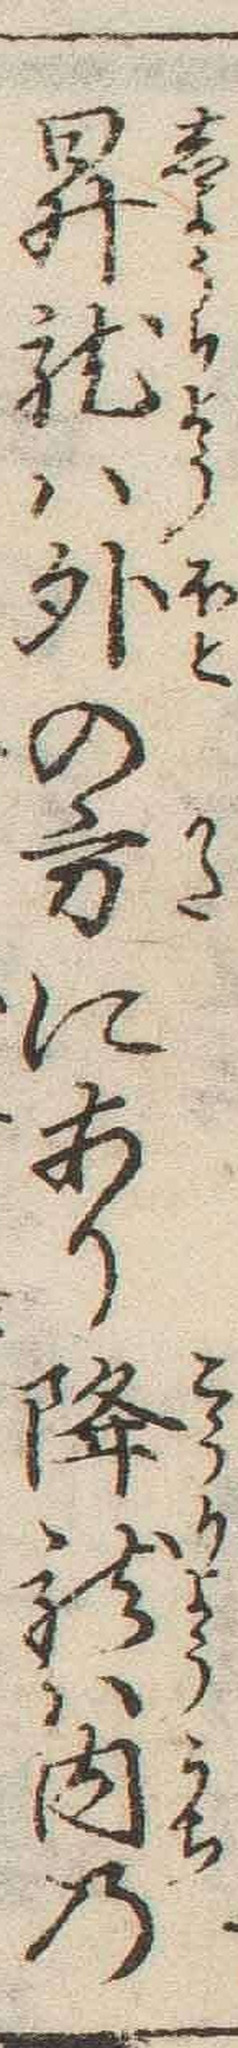昇龍は外の方にあり降龍は内の
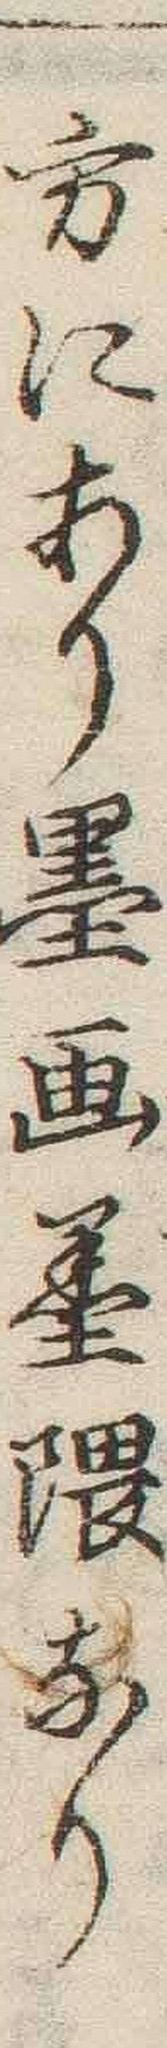方にあり墨画墨隈なり

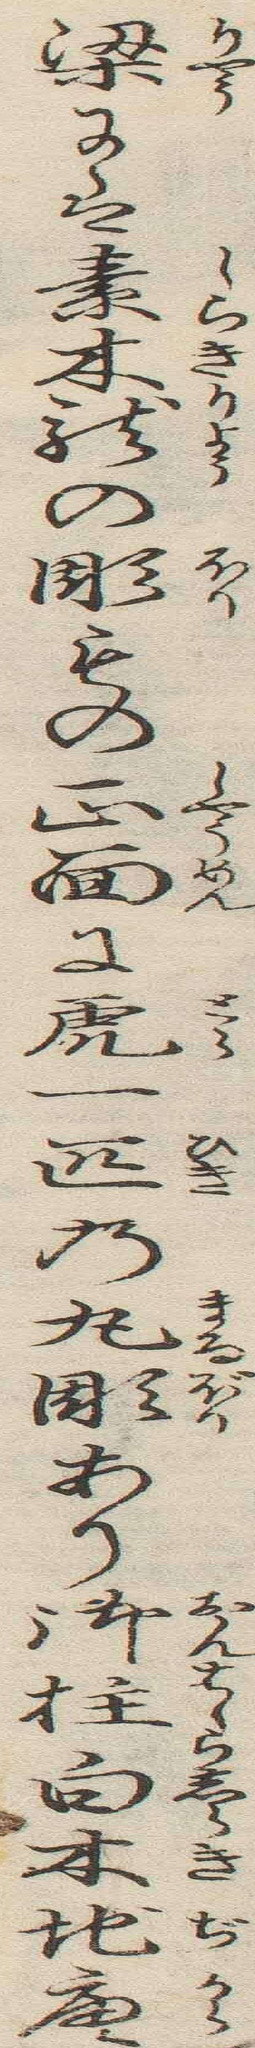梁には素木龍の彫もの正面に虎一匹の丸彫あり御柱白木地唐
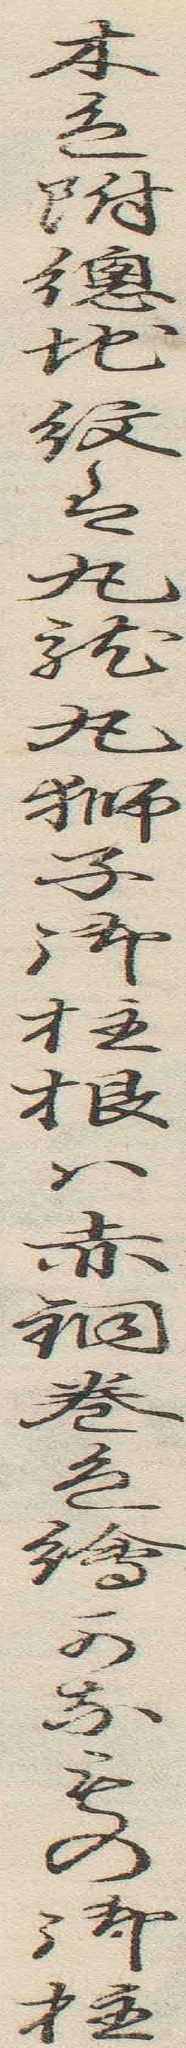木色附總地紋は丸龍丸獅子御柱根は赤銅巻色繪かなもの御柱
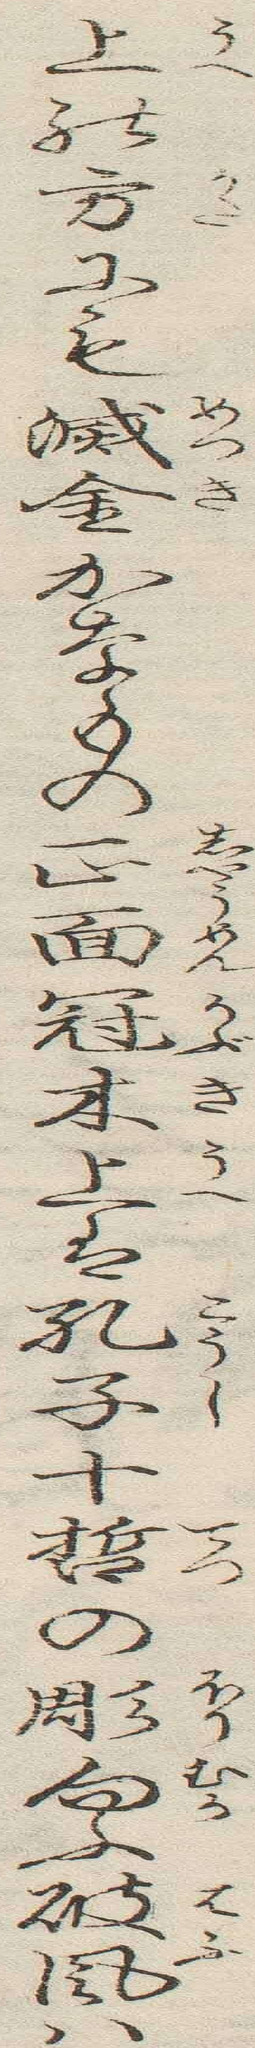上の方にも滅金かなもの正面冠木上は孔子十哲の彫向ふ破風は
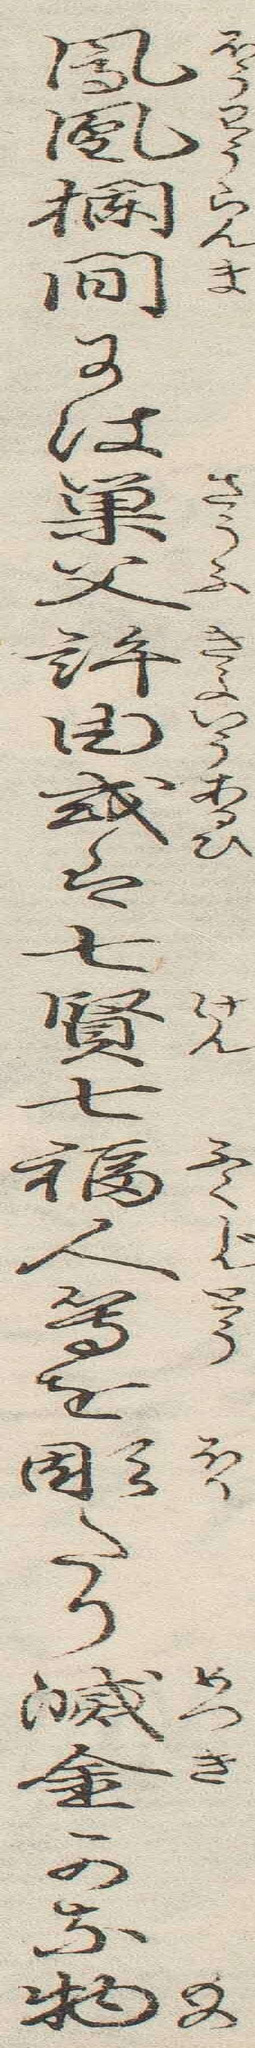鳳凰欄間には巣父許由或は七賢七福人等を彫たり滅金かな物
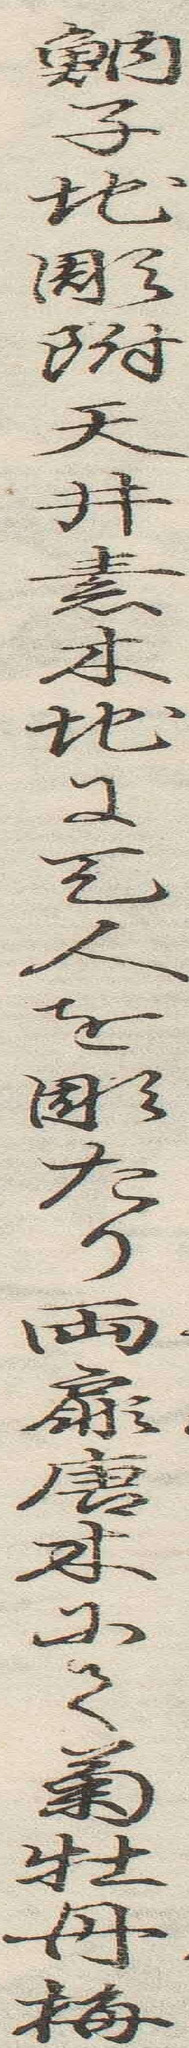魶子地彫附天井素木地に天人を彫たり両扉唐木にて菊牡丹梅
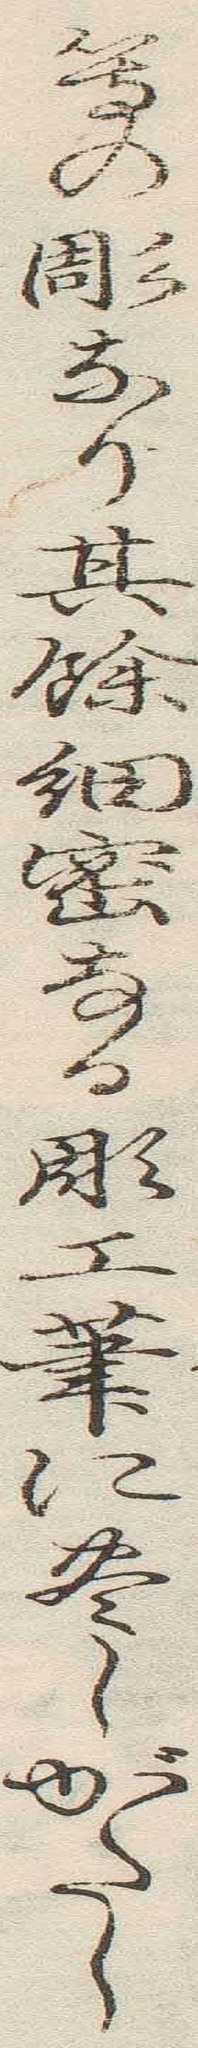等の彫なり其餘細密なる彫工筆に尽しがたし
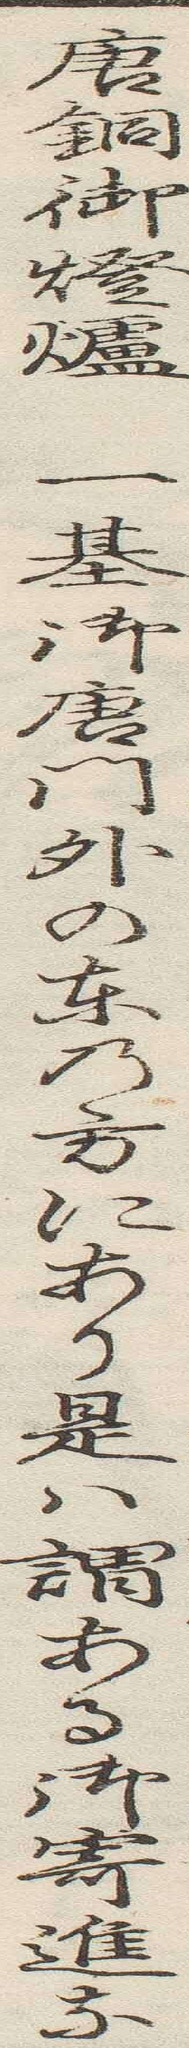唐銅御燈爐一基御唐門外の東の方にあり是は謂ある御寄進な
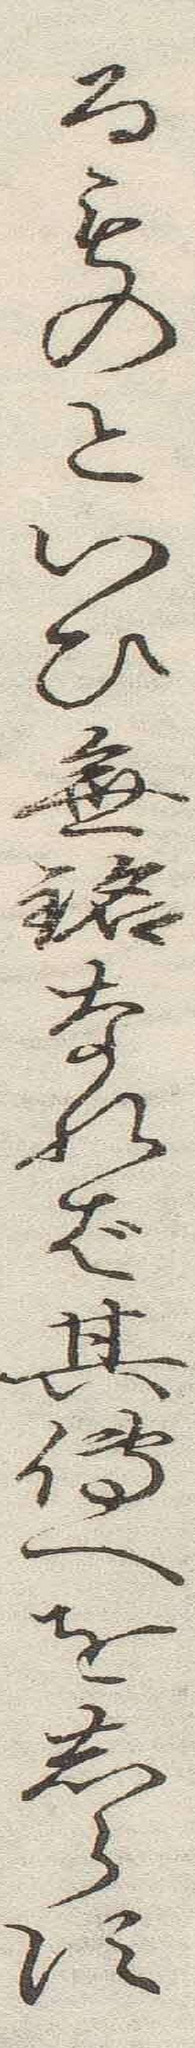るものといひ無銘なれば其傳へをしらす
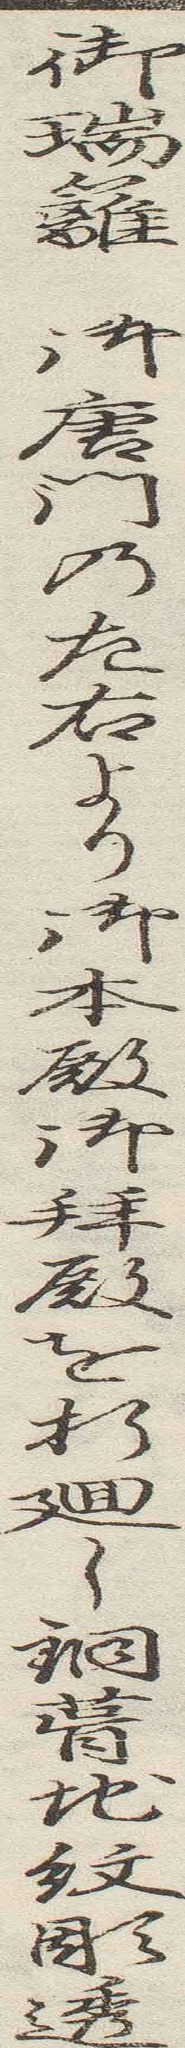御瑞籬御唐門の左右より御本殿御拜殿を折廽し銅葺地紋彫透
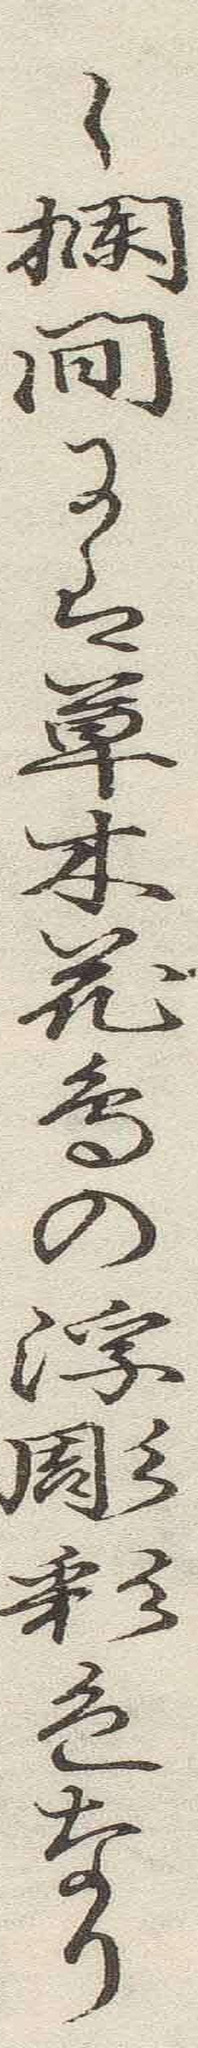し欄間には草木花鳥の浮彫彩色なり
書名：日光山志
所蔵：東京学芸大学附属図書館 国文学研究資料館
